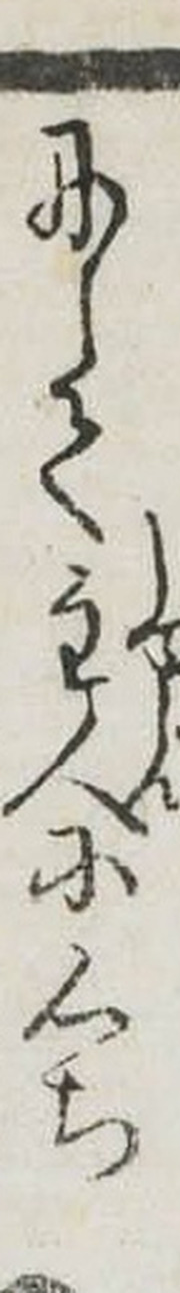にして主人にくち
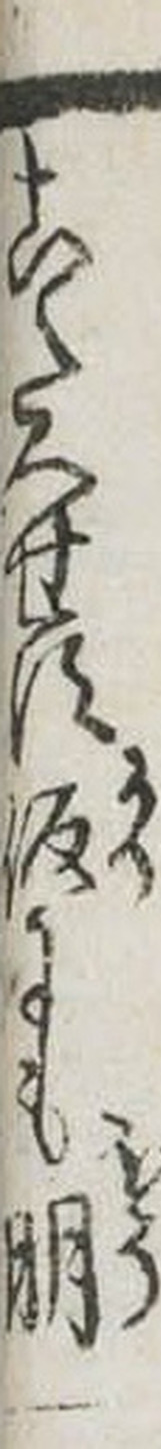こたへせす仮にも朋
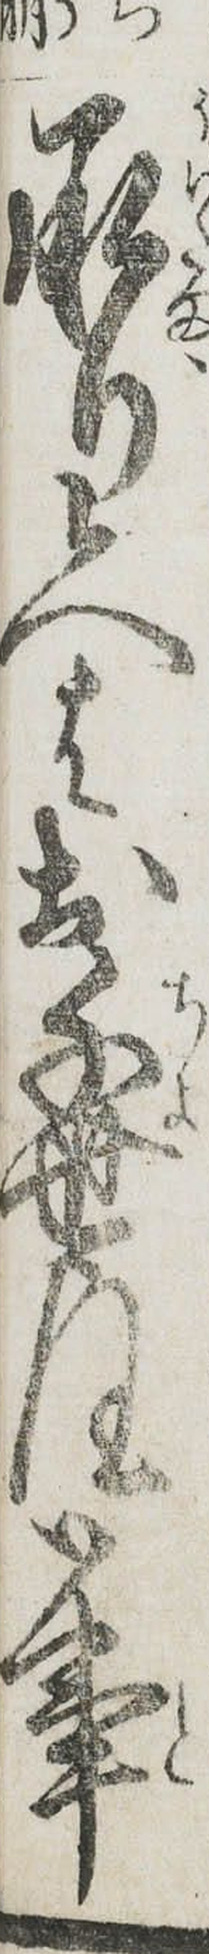承り候へはお千世さま御事
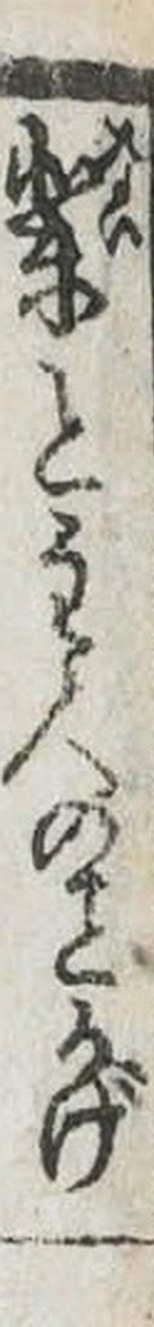輩と主人のことかげ
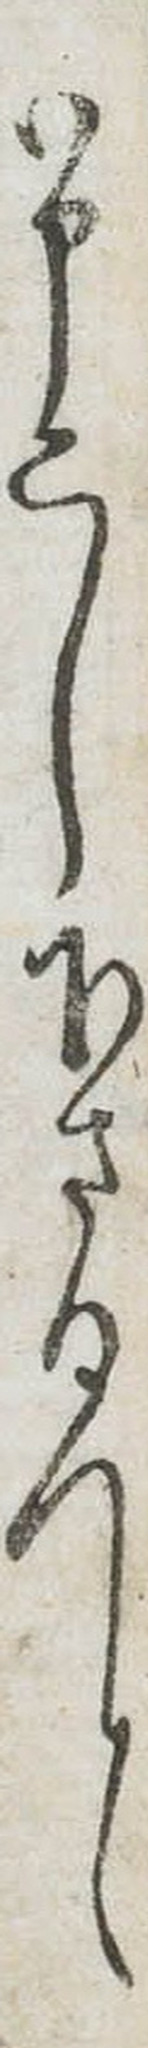御申こし下さるへく候
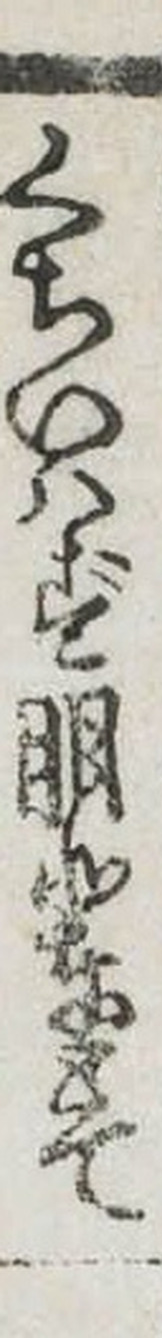くちいはず朋輩とて
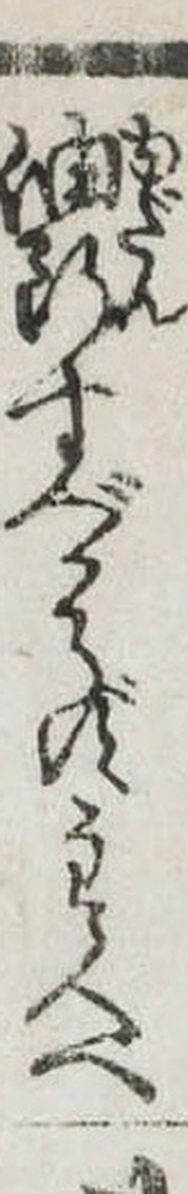油断すべからず主人へ
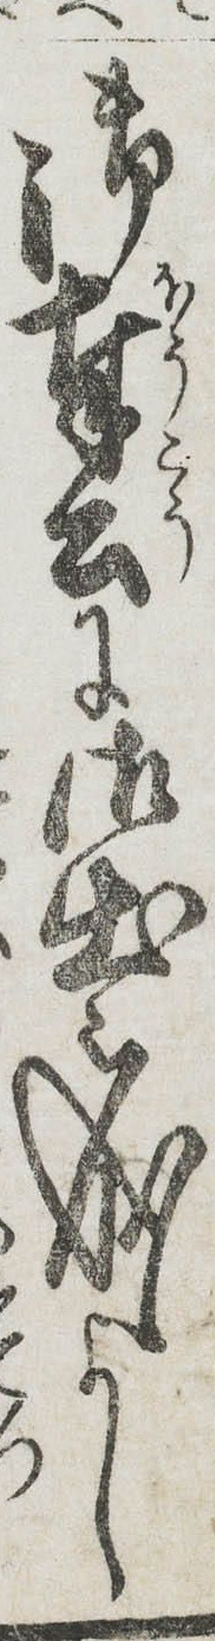御奉公に御出被成候よし
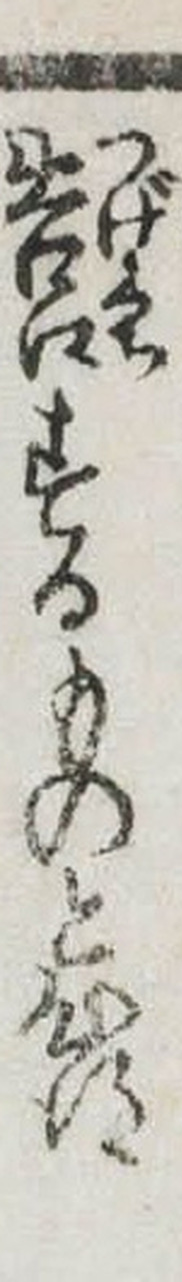告口するものと心得
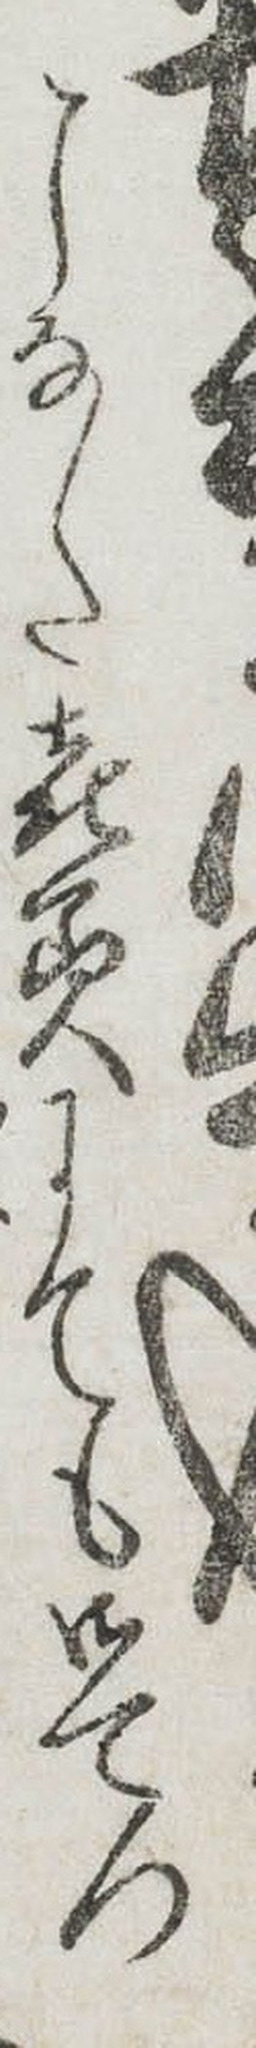こなた喜美にても御てつ
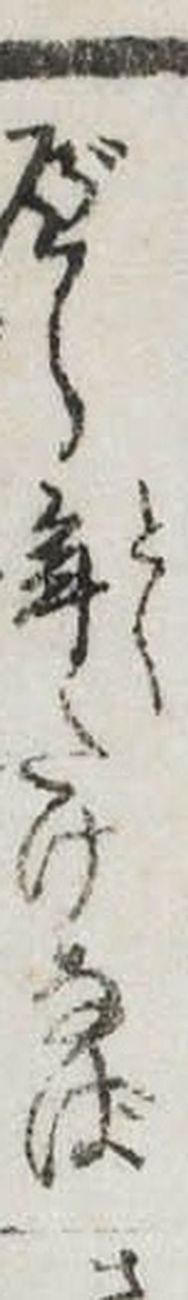べし年たけなば
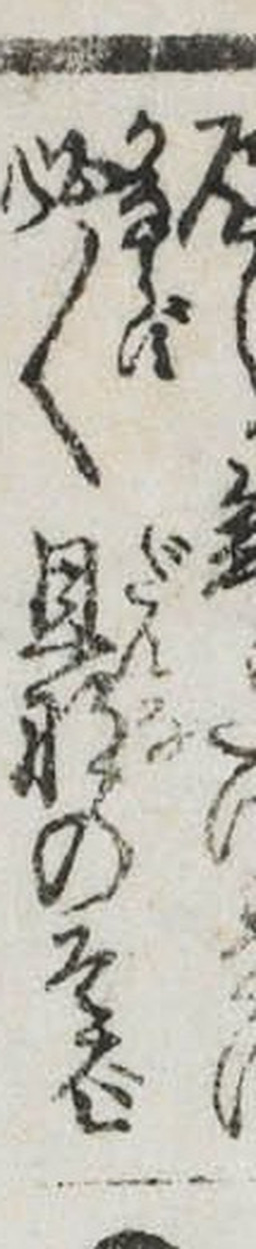必〳〵旦那のそば
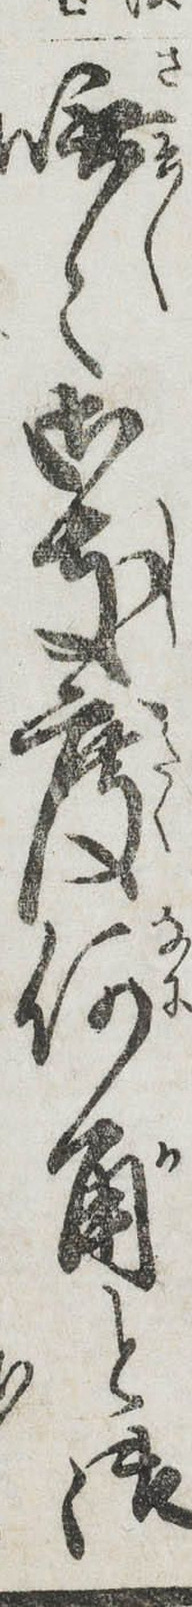嘸々御支度何角と御
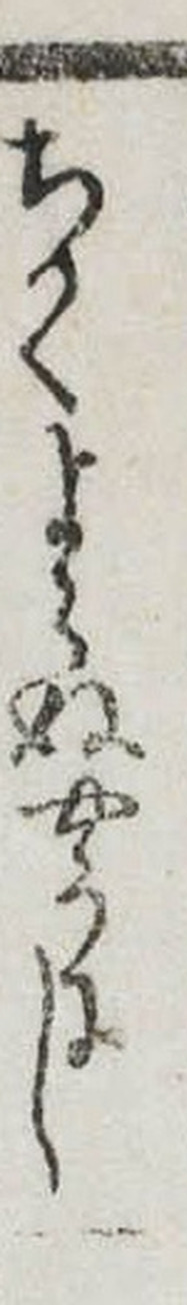ちかくよらぬやうにし
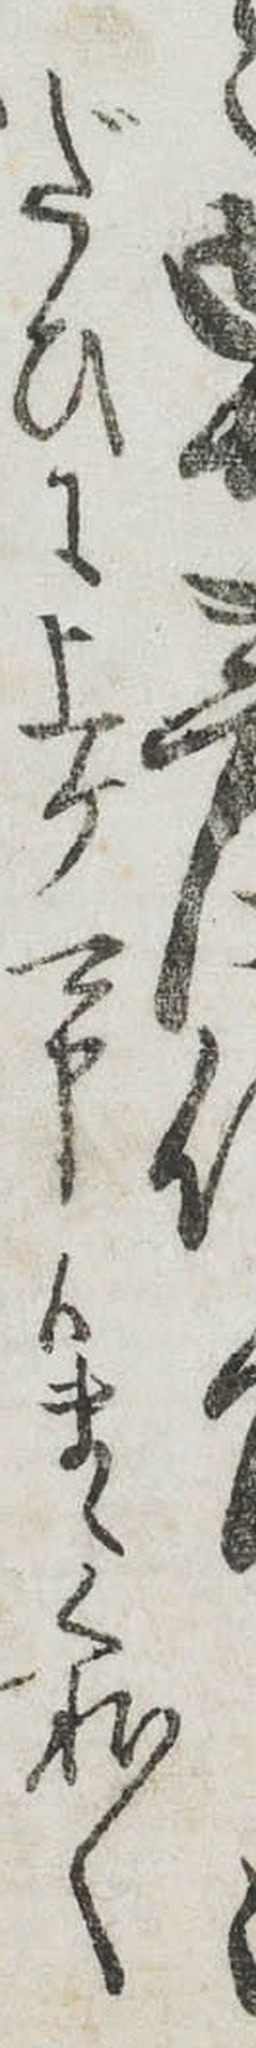だひに上ケ可申候まゝくれ〳〵
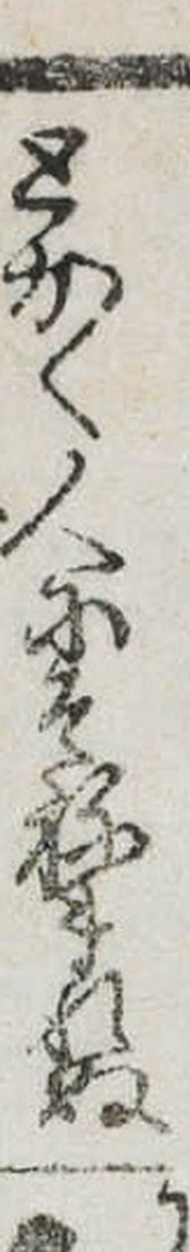とかく人にそねまれぬ
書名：頭書萬用婦人手紙之文言
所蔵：東京学芸大学教育コンテンツアーカイブ
